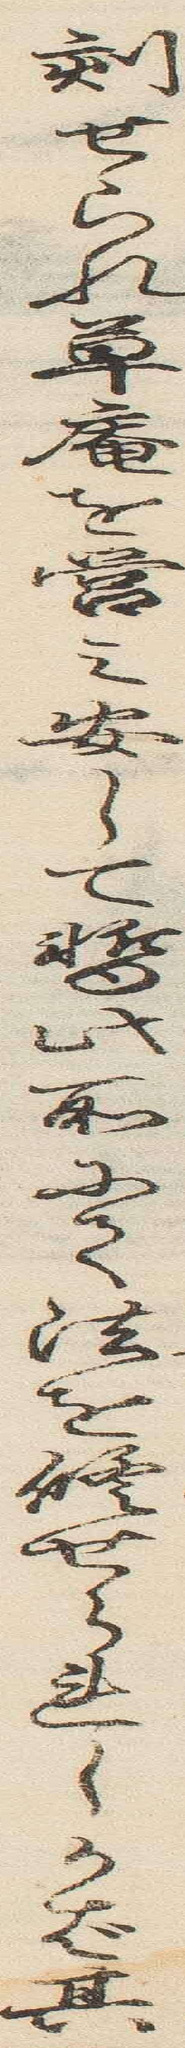𠜇せられ草庵を営み安して暫此所にて法を修せられしかば其
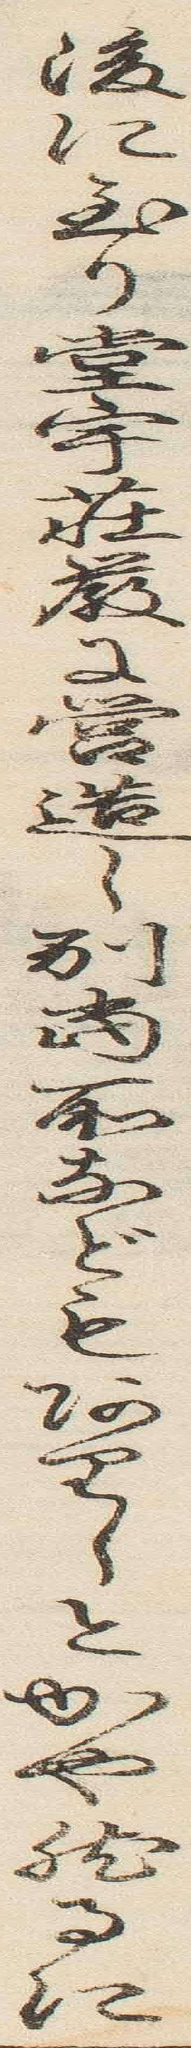後に至り堂宇荘厳に営造し別當所などもありしとかや然るに
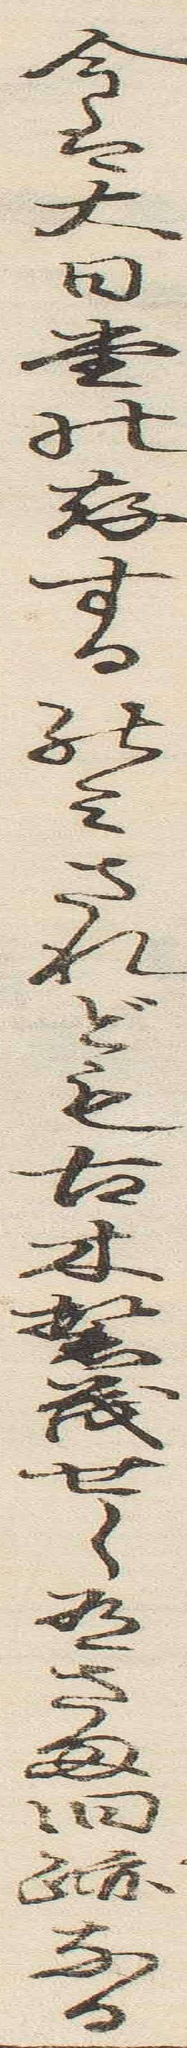今は大日堂の存するのみされども古木繁茂せし有さま旧跡なる
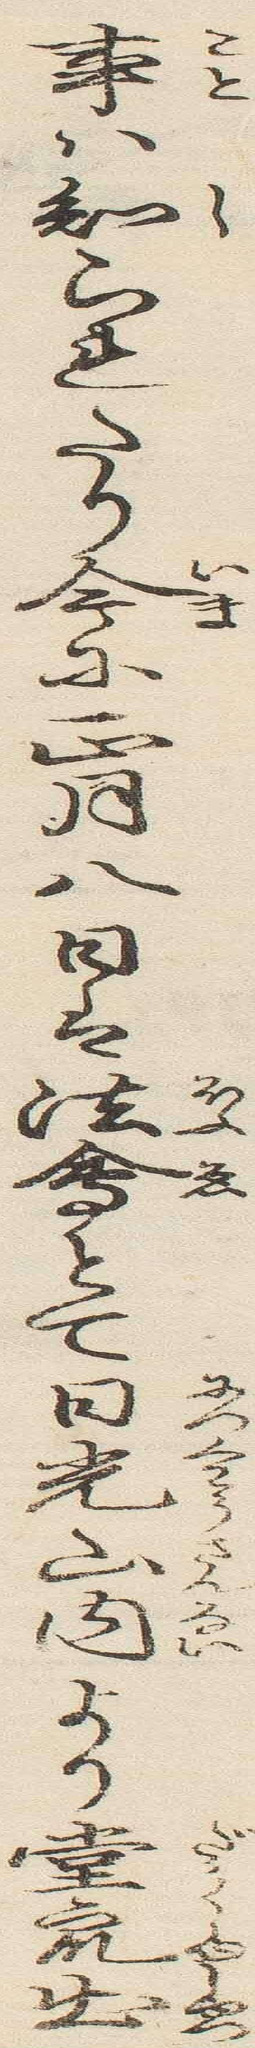事は知られたり今に正月八日は法會とて日光山内より堂衆出
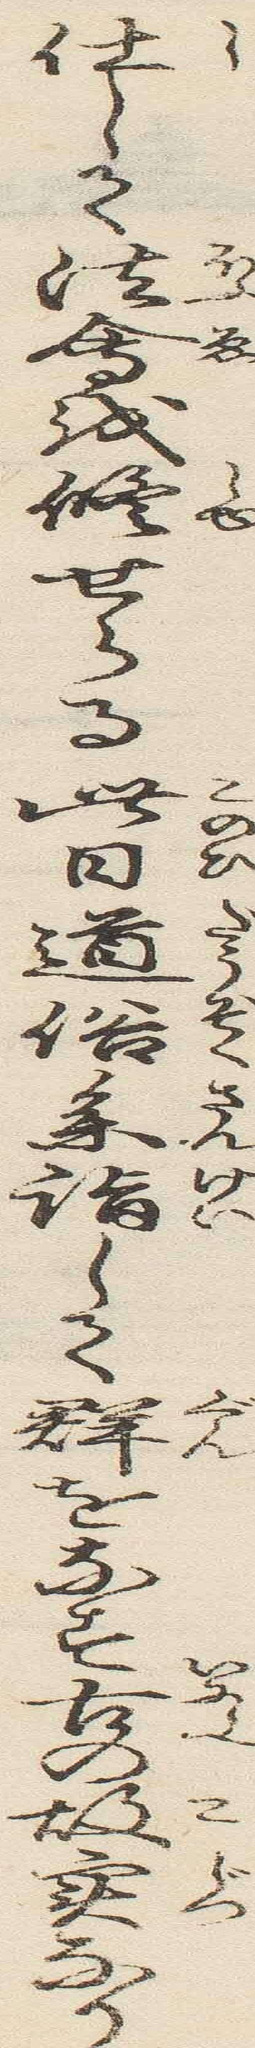仕して法會を修せらる此日道俗参詣して群をなす古の故実なり
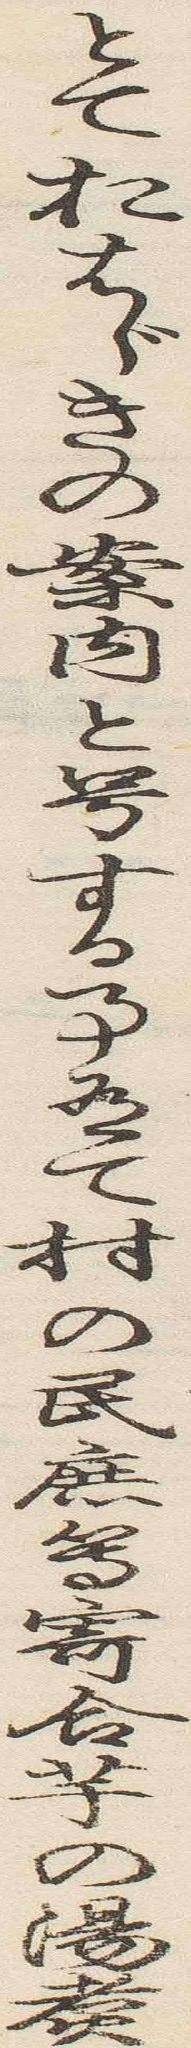とておはじきの案内と号する事有て村の民庶等寄合芋の湯煑
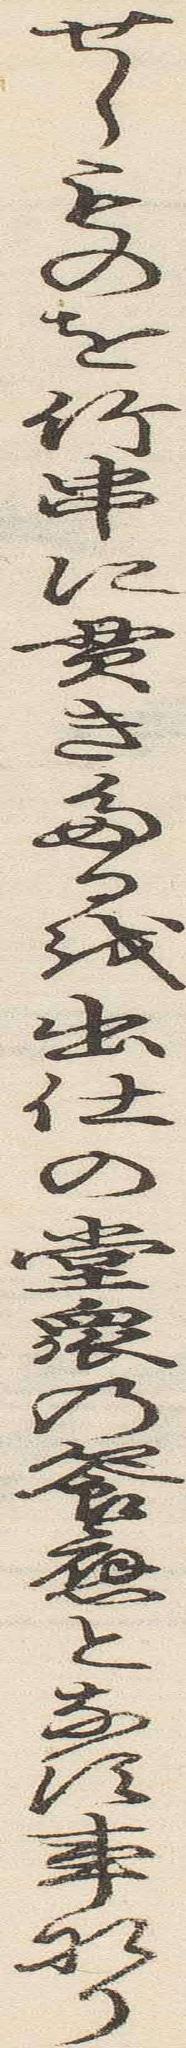せしものを竹串に貫きたるを出仕の堂衆の饗應となす事なり
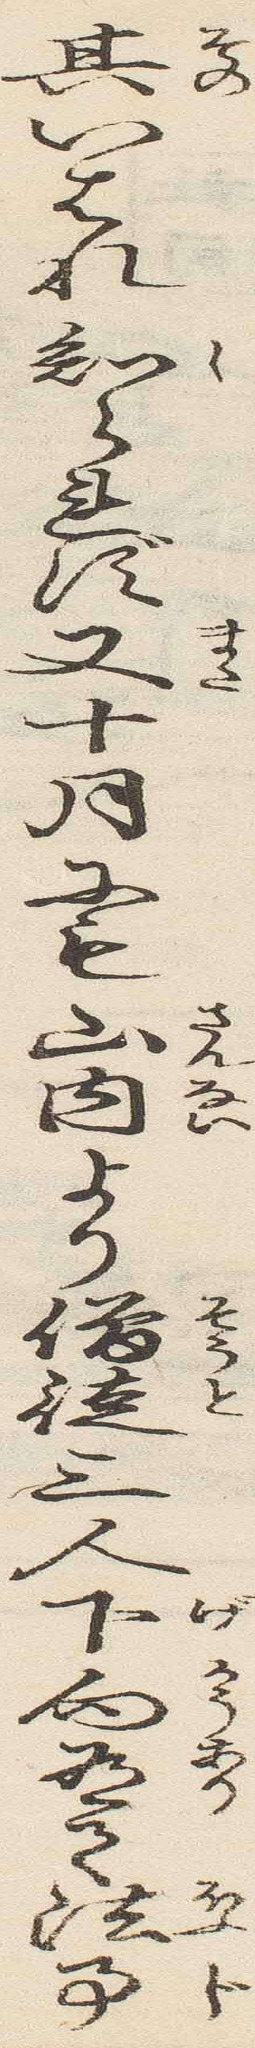其いはれ知られず又十月にも山内より僧徒三人下向有て法事
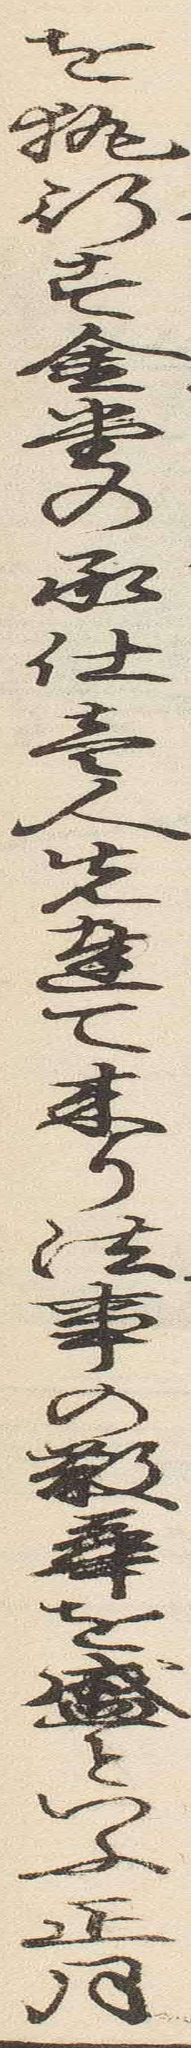を執行す金堂の承仕壱人先達て來り法事の散蕐を盛といふ正月
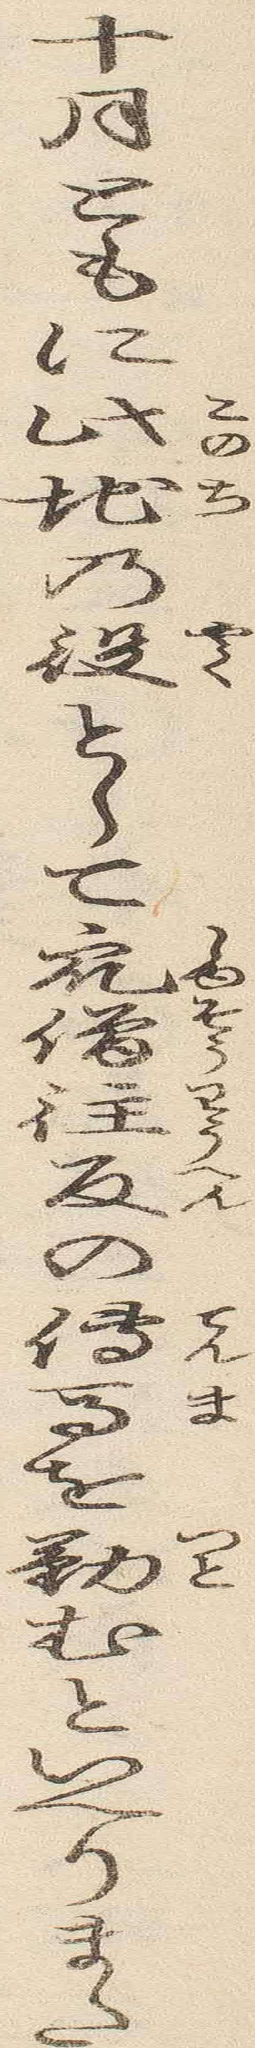十月ともに此地の役として衆僧往反の傳馬を勤むといへりまた
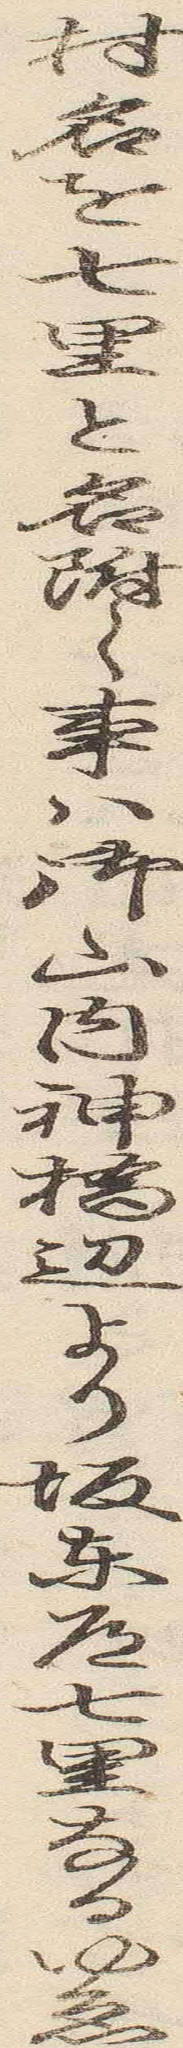村名を七里と名附し事は御山内神橋辺より坂東道七里なるゆゑ
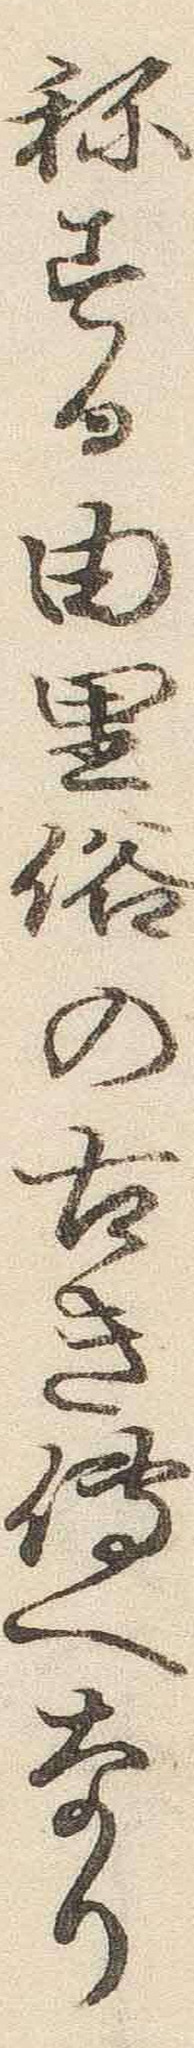称する由里俗の古き傳へなり
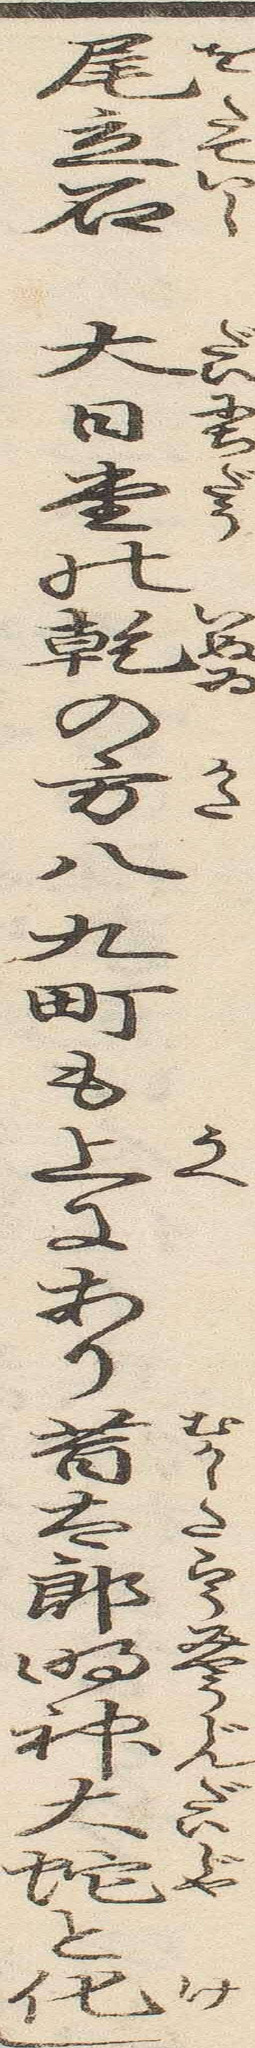尾立石大日堂の乾の方八九町も上にあり昔太郎明神大蛇と化し
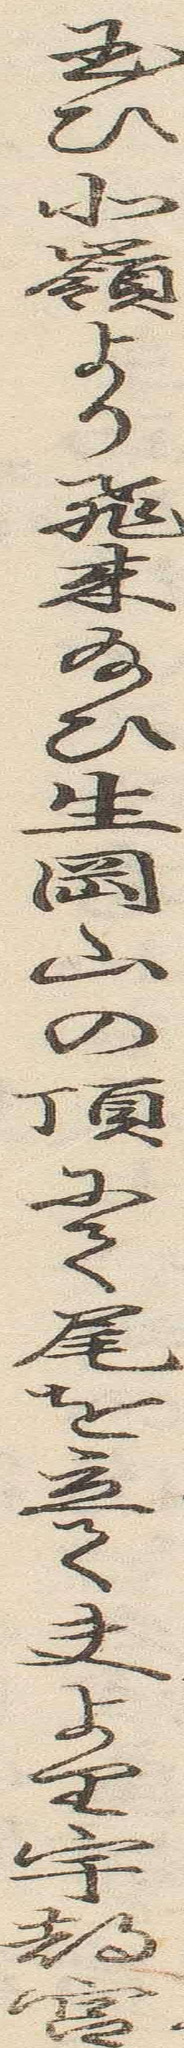玉ひ北嶺より飛來給ひ生岡山の頂にて尾を立て夫より宇都宮
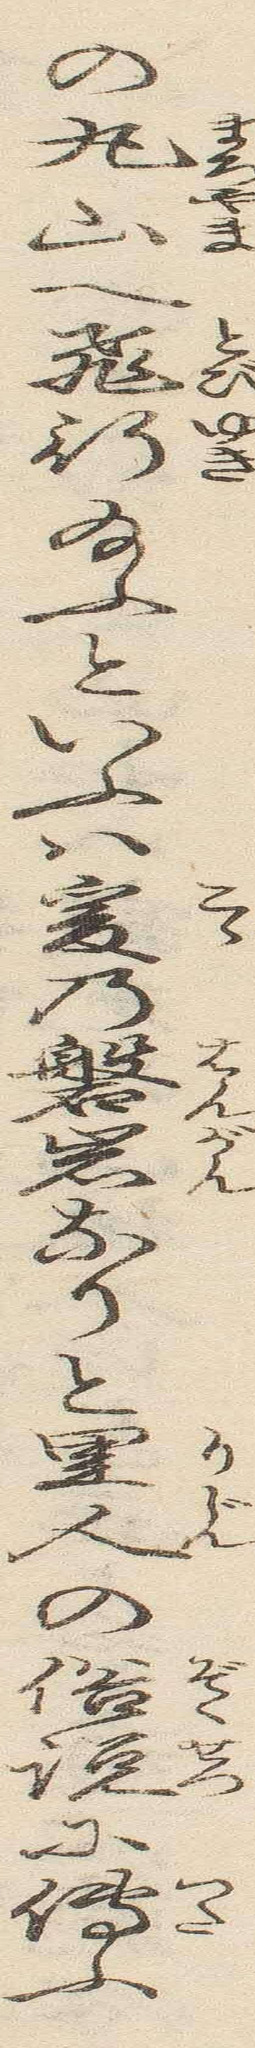の丸山へ飛行給ふといふは爰の磐岩なりと里人の俗説に傳ふ
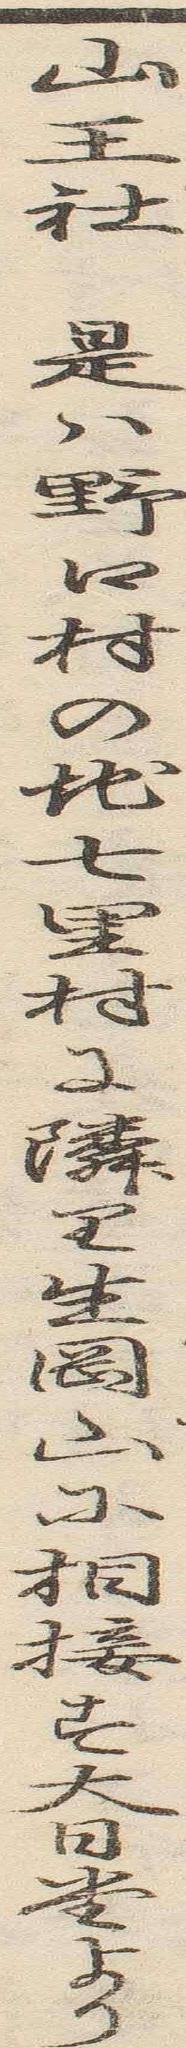山王社是は野口村の地七里村に隣り生岡山に相接す大日堂より
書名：日光山志
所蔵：東京学芸大学附属図書館 国文学研究資料館
